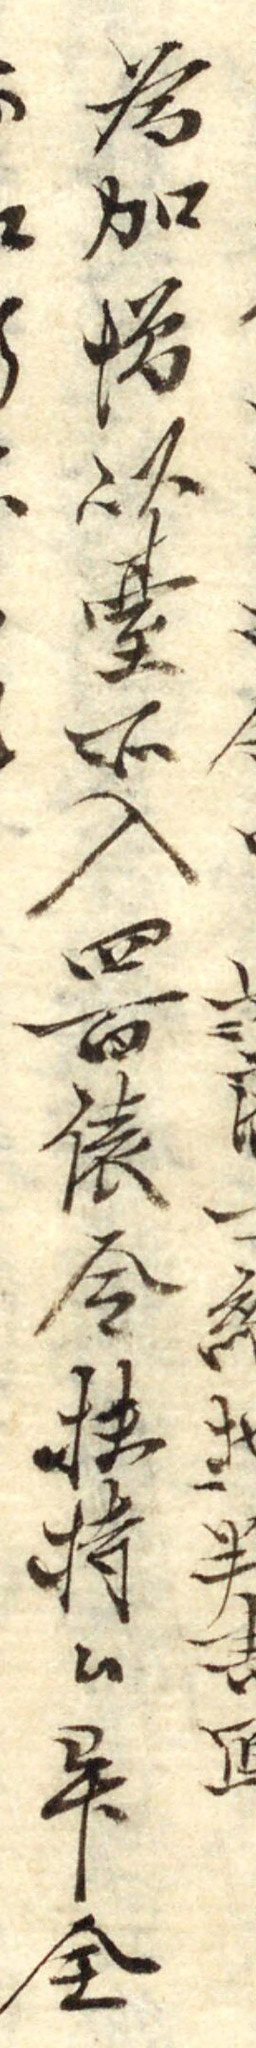為加増為臺所入四百俵令扶持候畢全
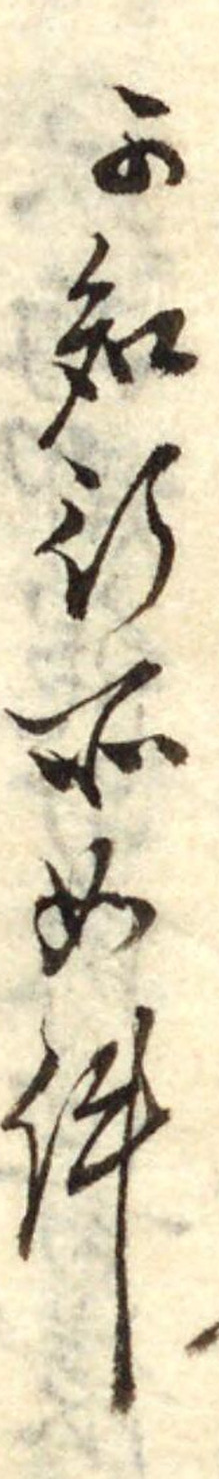可知行所如件
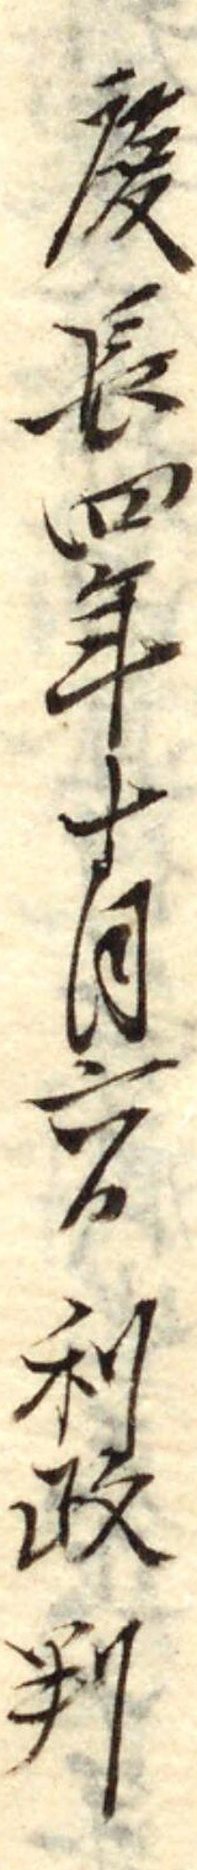慶長四年十月六日利政判
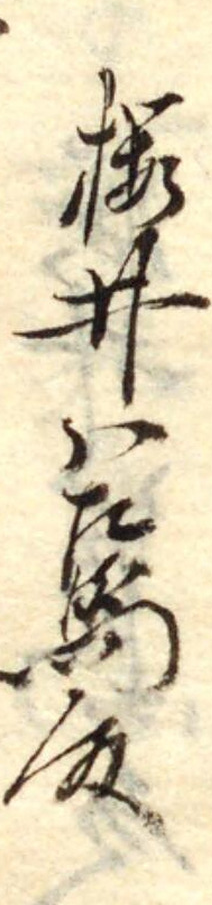桜井八左衛門殿
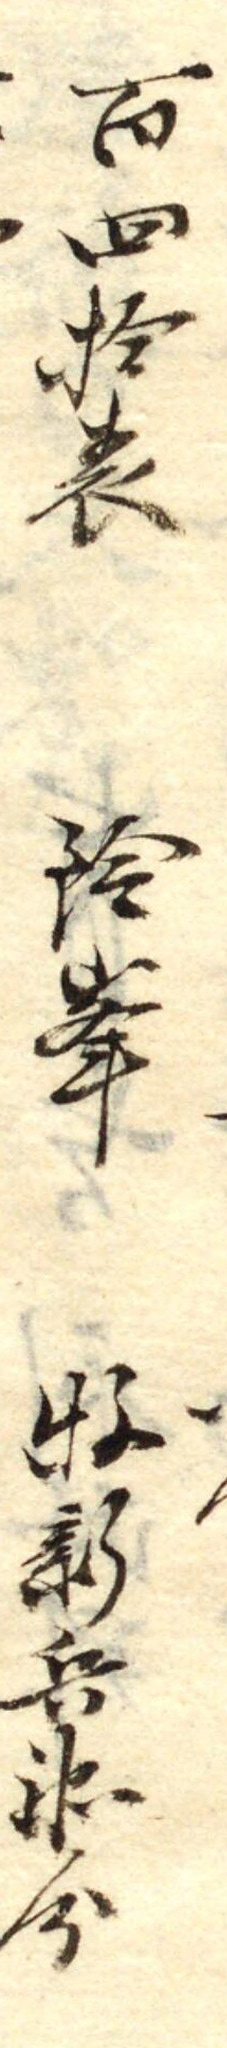百四拾表鈴峯牧新兵衛分
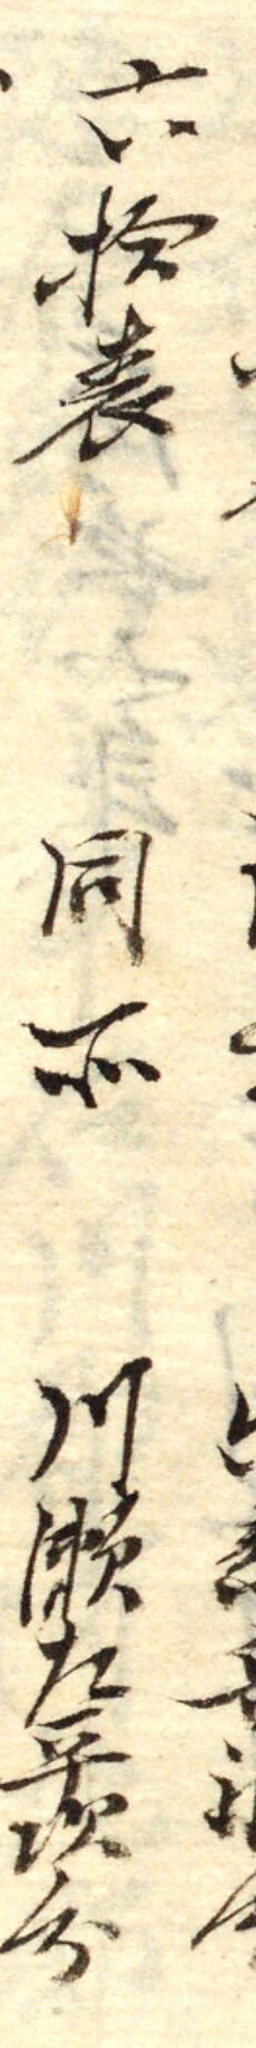六拾表同所川瀬左平次分
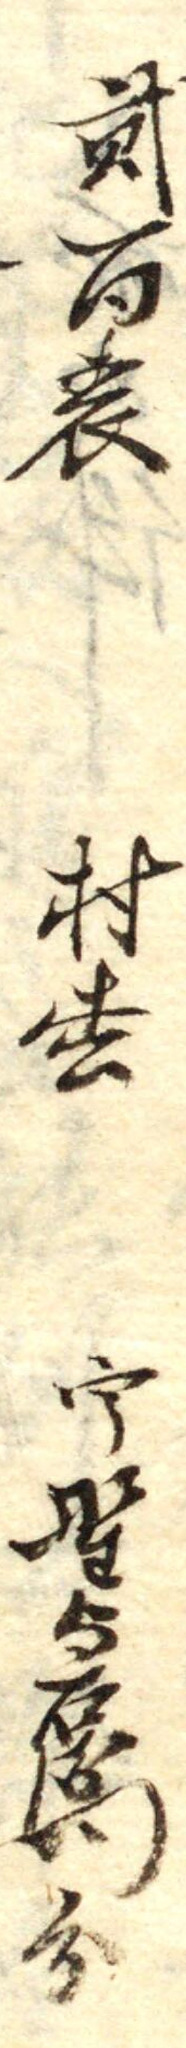貳百表村松宇野与右衛門分
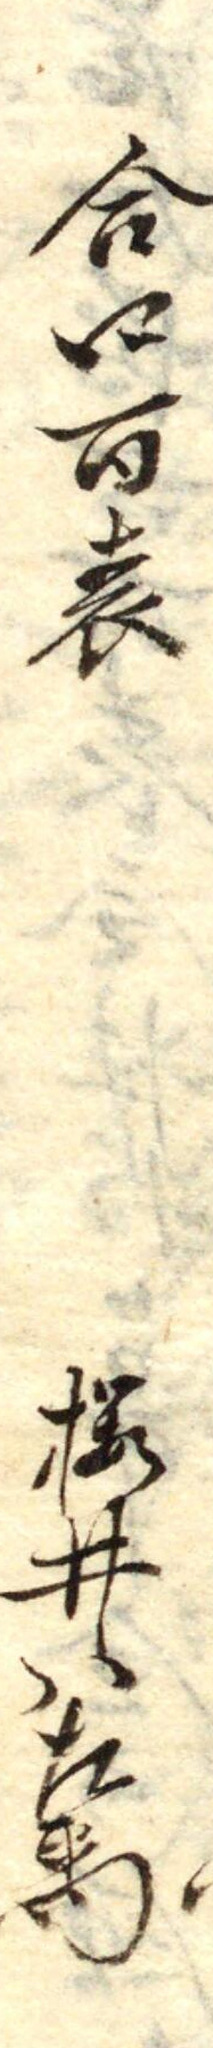合四百表桜井八左衛門
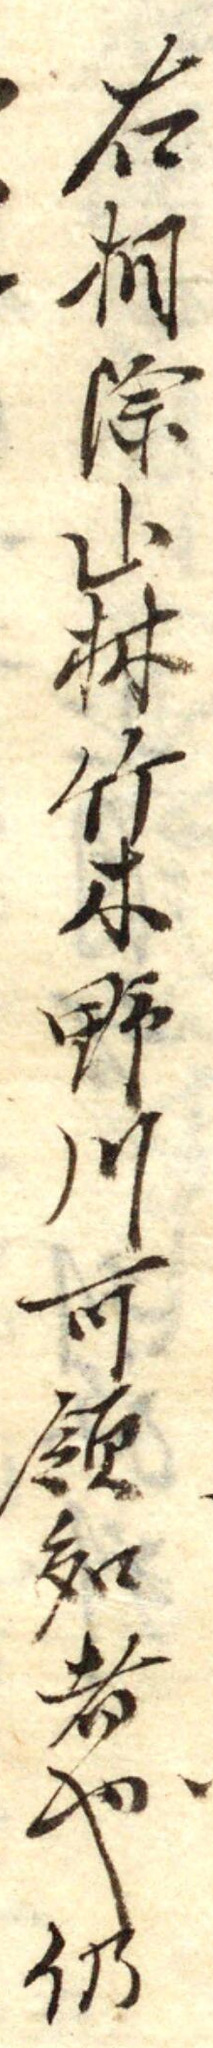右相除山林竹木野川所領知者也仍

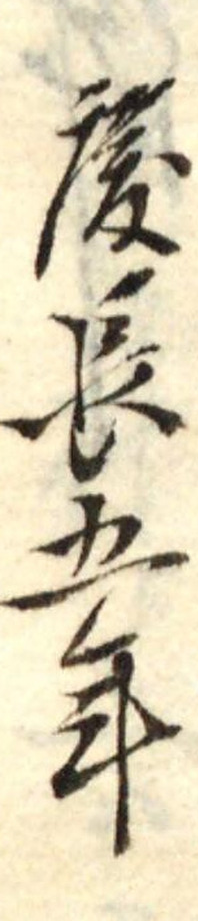慶長五年
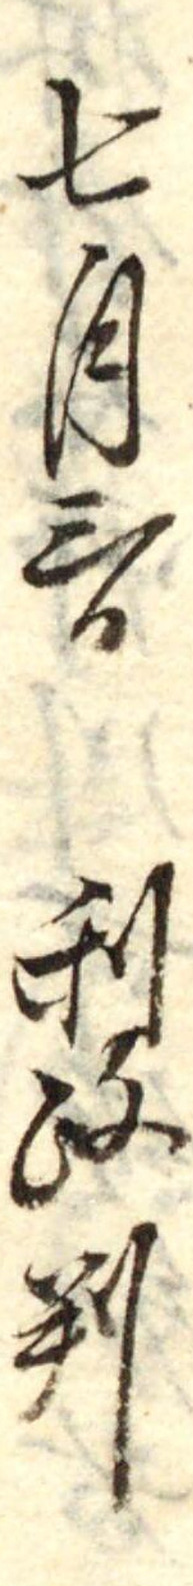七月三日利政判
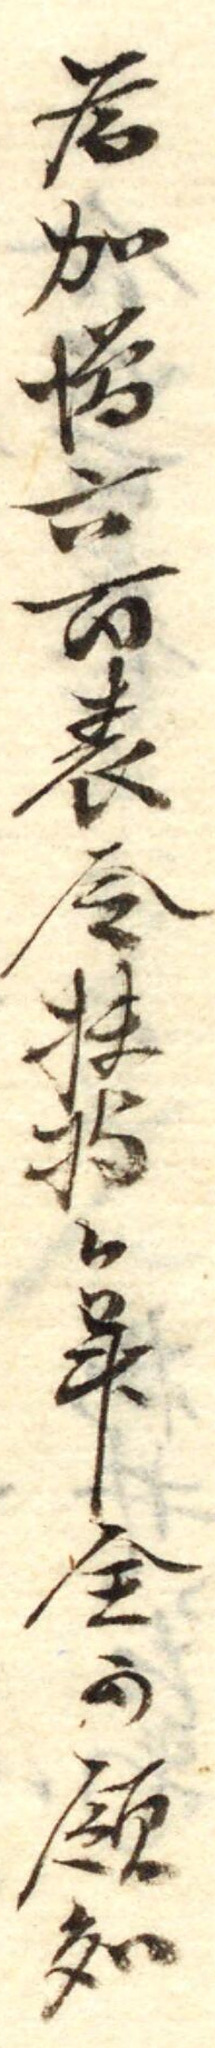為加増六百表令扶持候畢全可領知
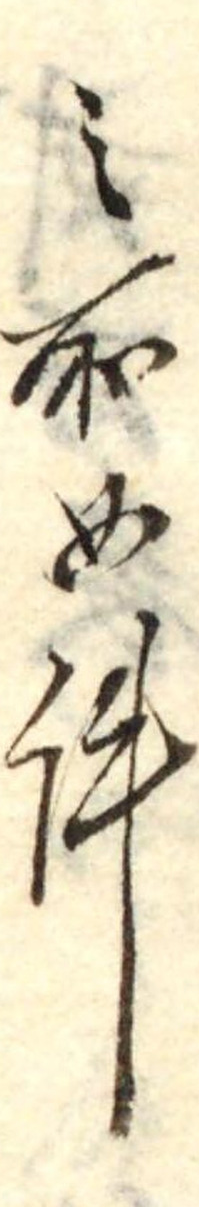之所如件
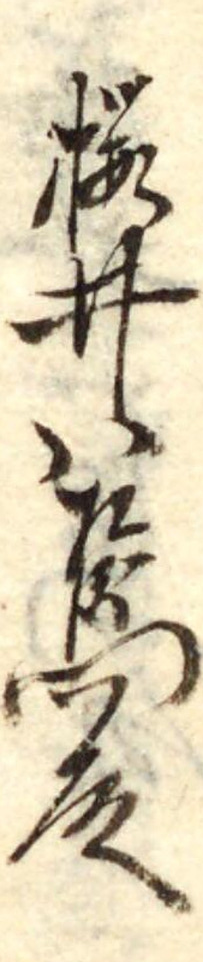桜井八左衛門殿
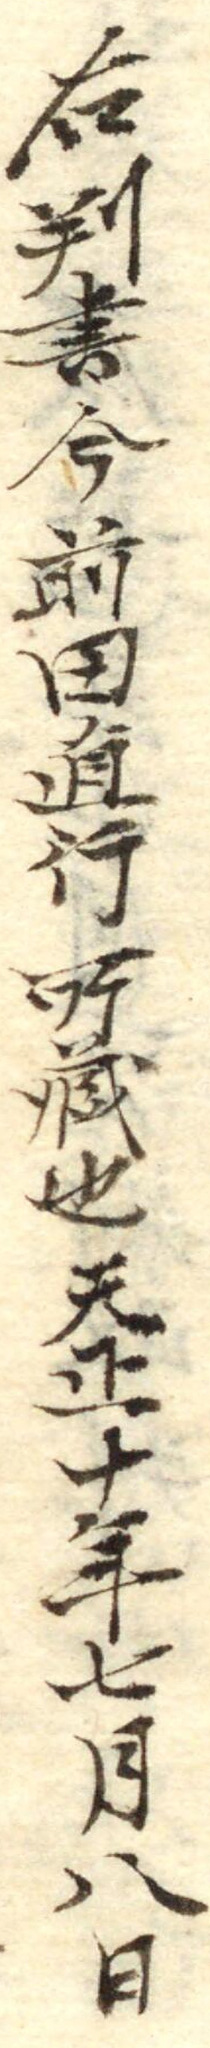右判書今前田直行所蔵也天正十年七月八日
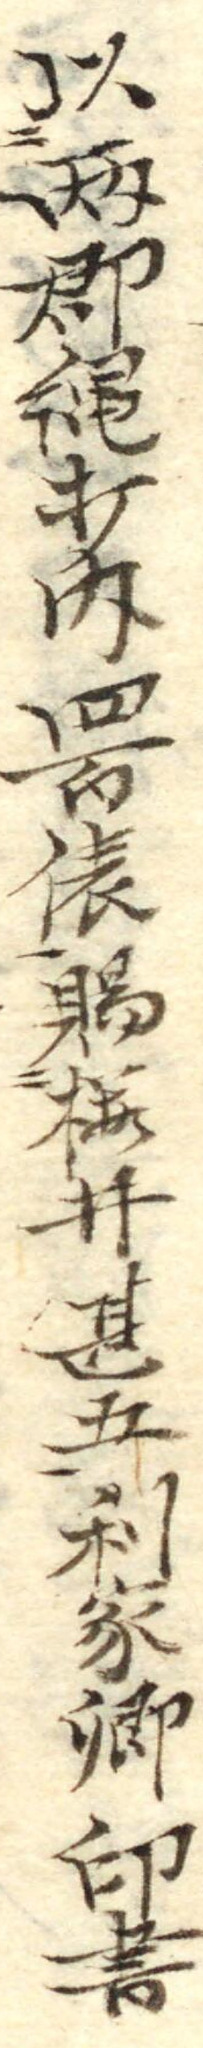以両郡縄打内四百俵賜桜井甚五利家卿印書
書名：前田家封国証書集録
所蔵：Ishikawa Prefectural Library
